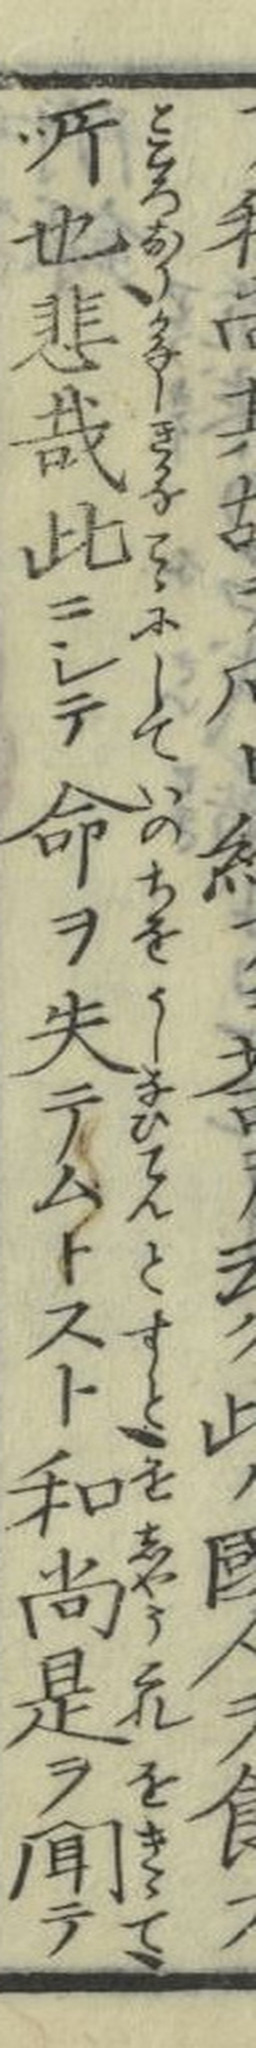所也、悲哉此ニシテ命ヲ失テムトスト、和尚是ヲ聞テ、
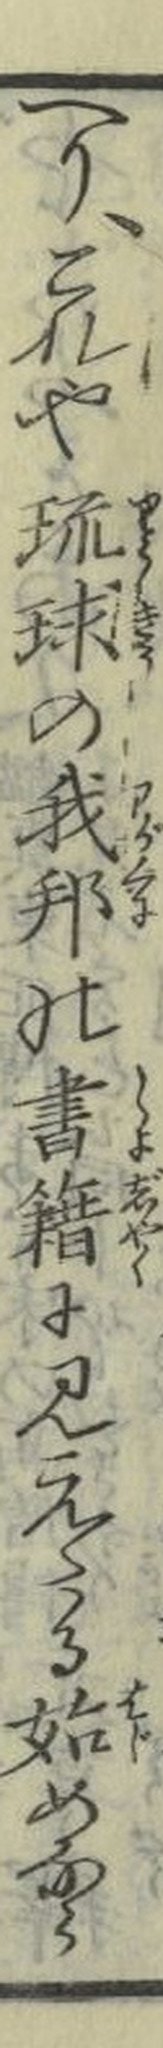へり、これや琉球の我邦の書籍に見えたる始めなら
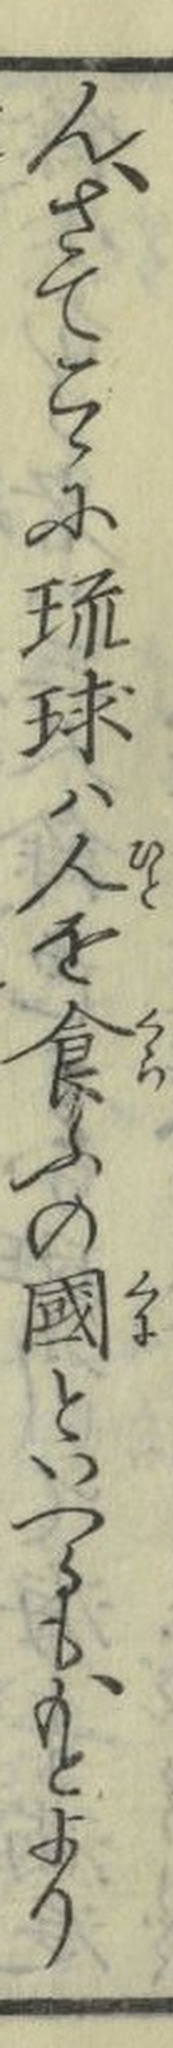ん、さてこゝに琉球は人を食ふの国といへるも、もとより
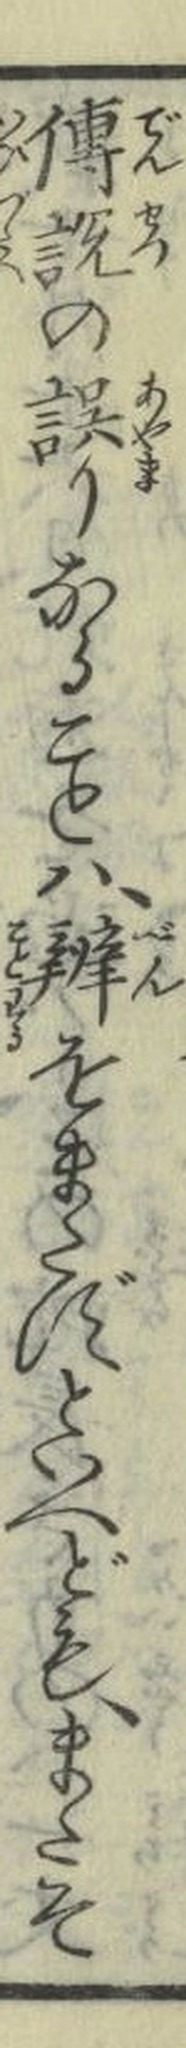伝説の誤りなることは、弁をまたずといへども、またそ
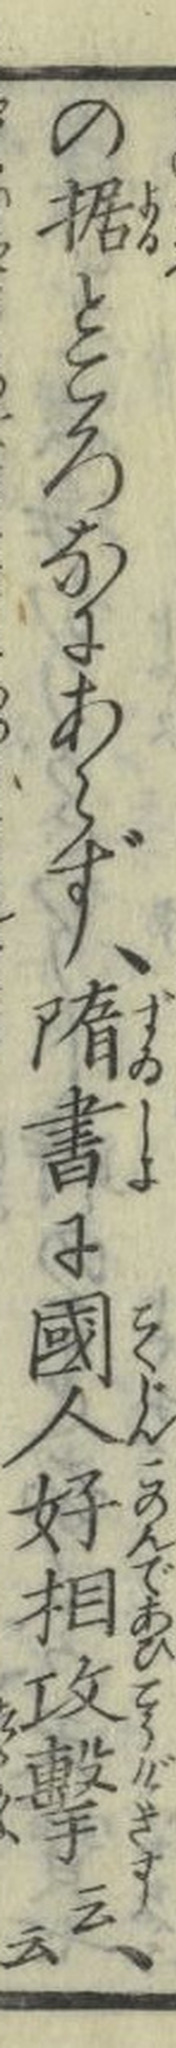の据ところなにあらず、隋書に国人好相攻撃云々、
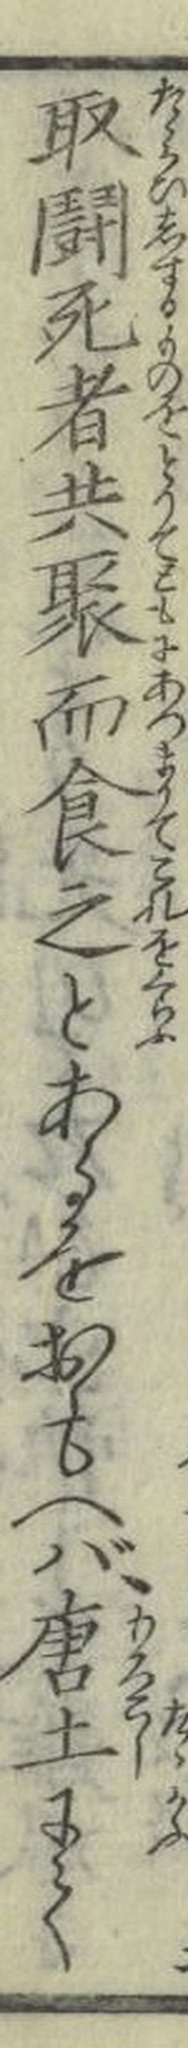取闘死者共聚而食之とあるをおもへば、唐土にて
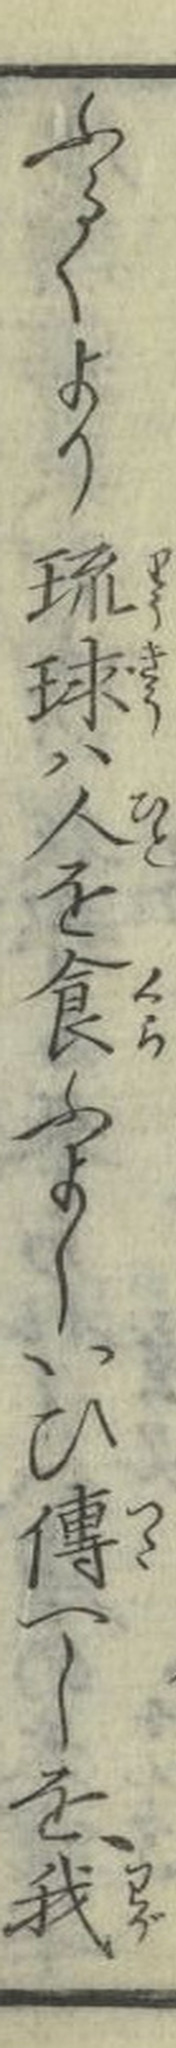ふるくより琉球は人を食ふよしいひ伝へしを、我
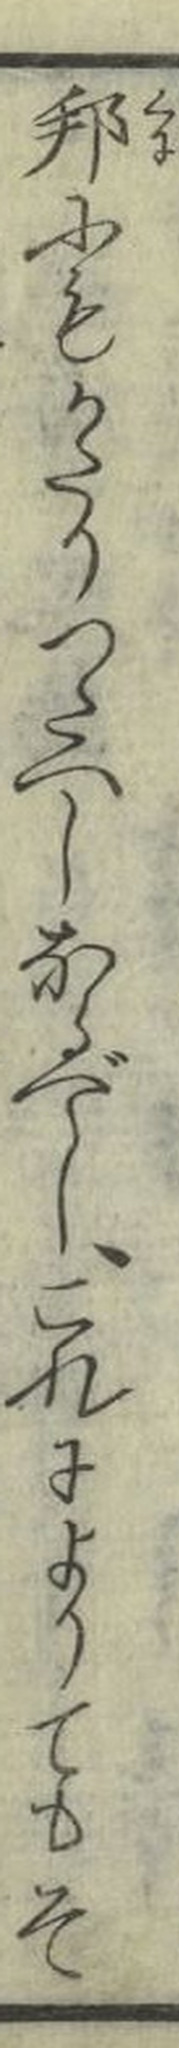邦にもかたりつたへしなるべし、これによりてもそ
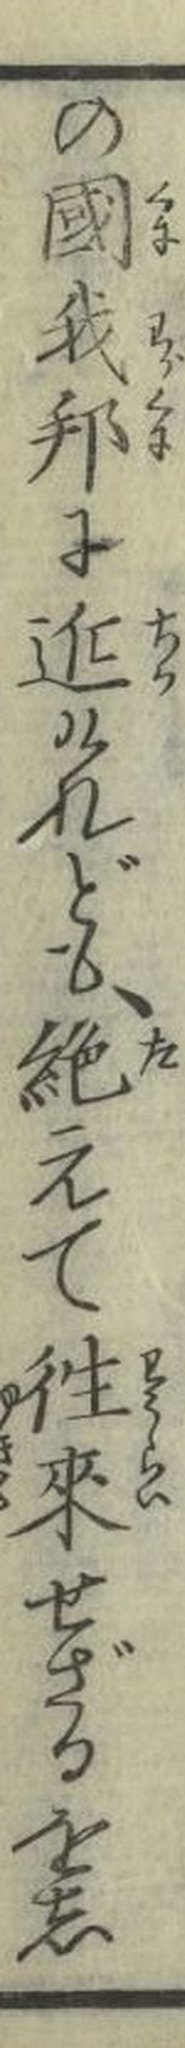の国我邦には近けれども、絶えて往来せざるをし

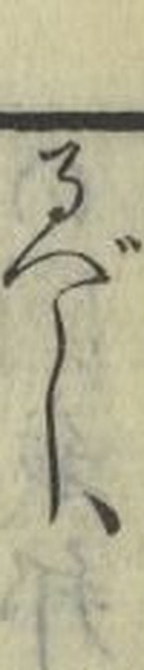るべし、
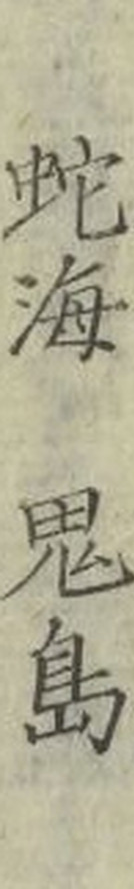蛇海鬼島
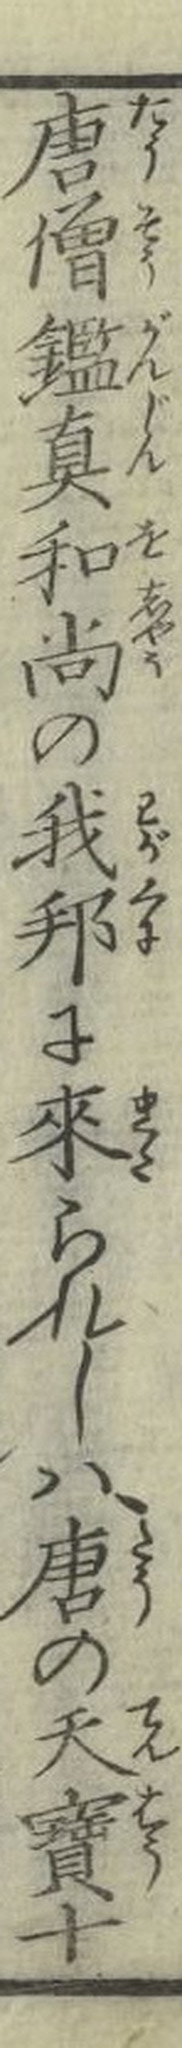唐僧鑑真和尚の我邦に来られしは、唐の天宝十
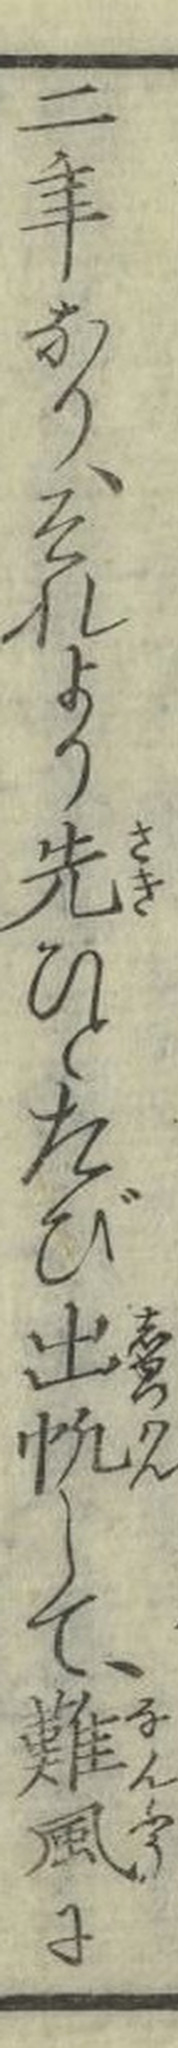二年なり、それより先ひとたび出帆して、難風に
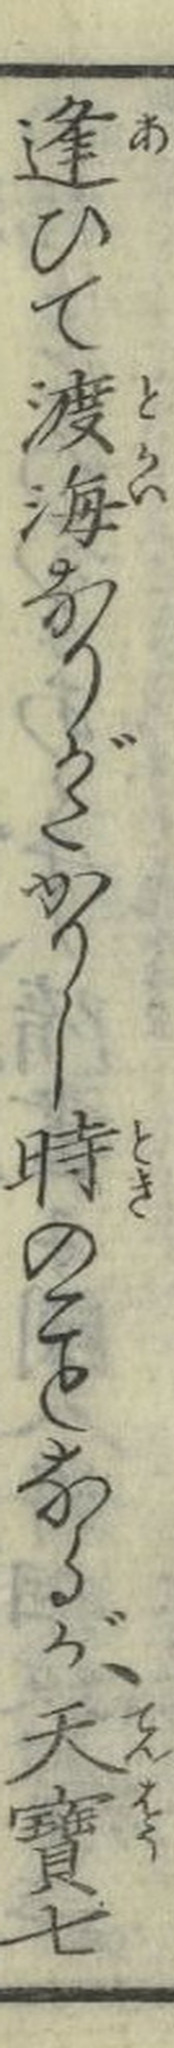逢ひて渡海なりがたかりし時のことなるが、天宝七
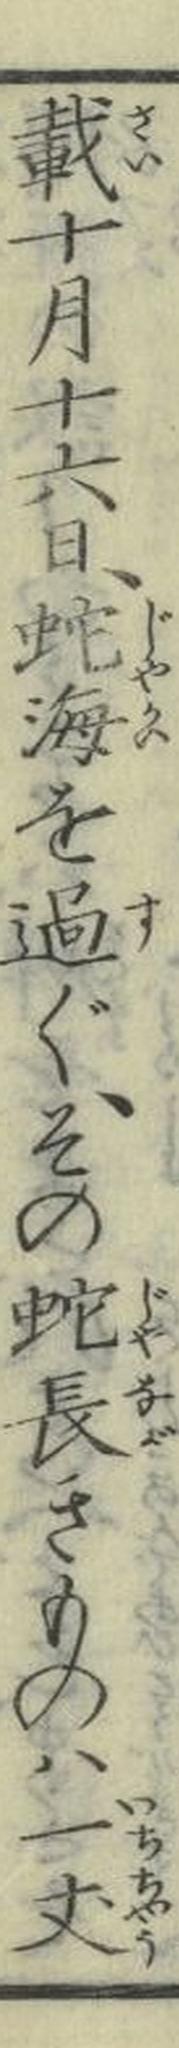載十月十六日、蛇海を過ぐ、その蛇長きものは一丈
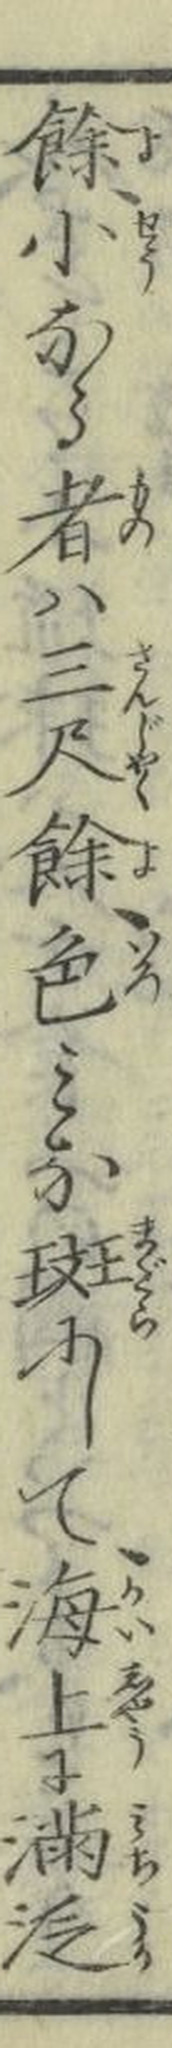余、小なる者は三尺余、色みな斑にして、海上に満泛
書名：琉球入貢紀畧
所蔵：University of the Ryukyus Library
